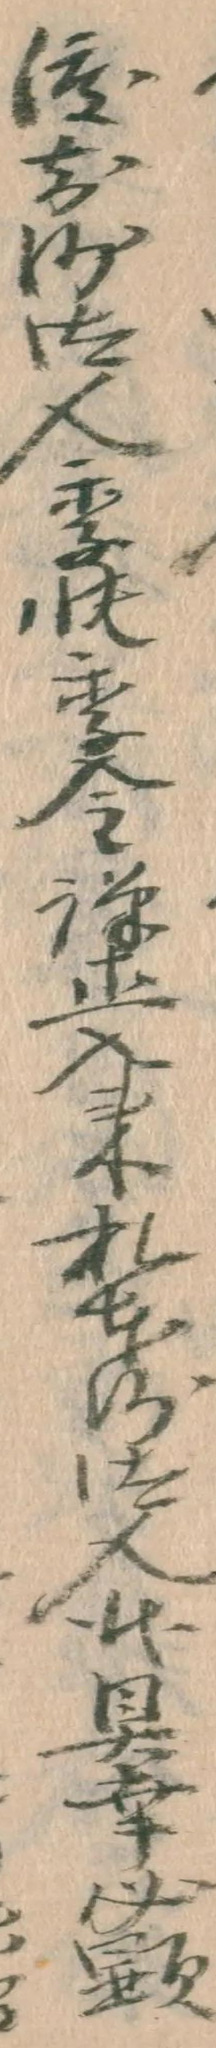渡前沙汰人季快季令帖譲直入来札本沙汰人代具幸必顕
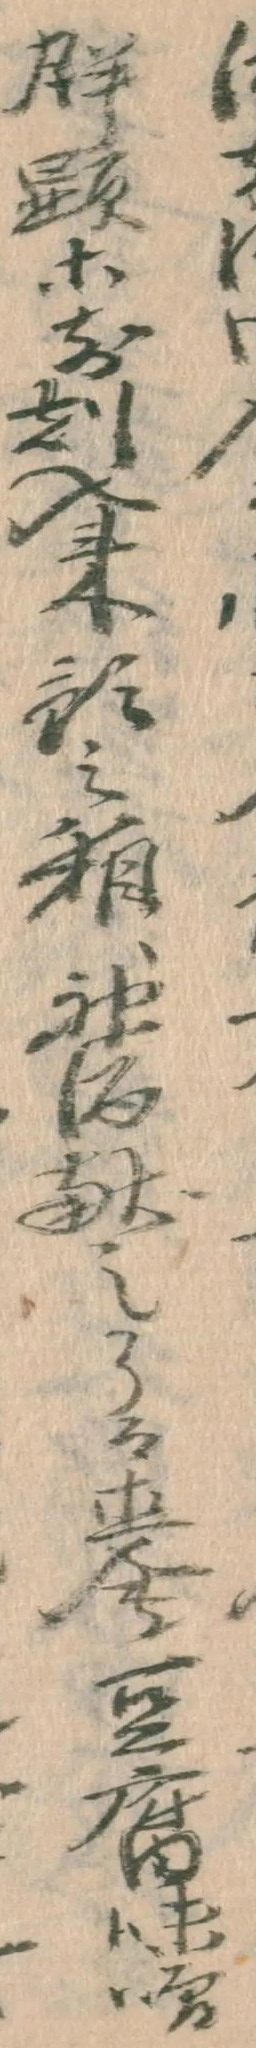胖顕等前刻入来預之箱へ神酒献之了而直會豆腐味噌
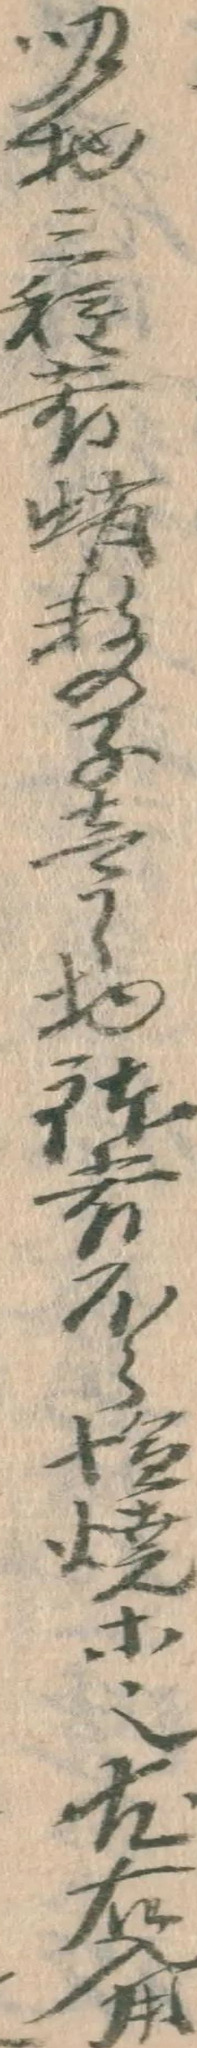吸物三種肴蛸数の子壱ツ物鉢肴ほら塩焼等也尤右入用
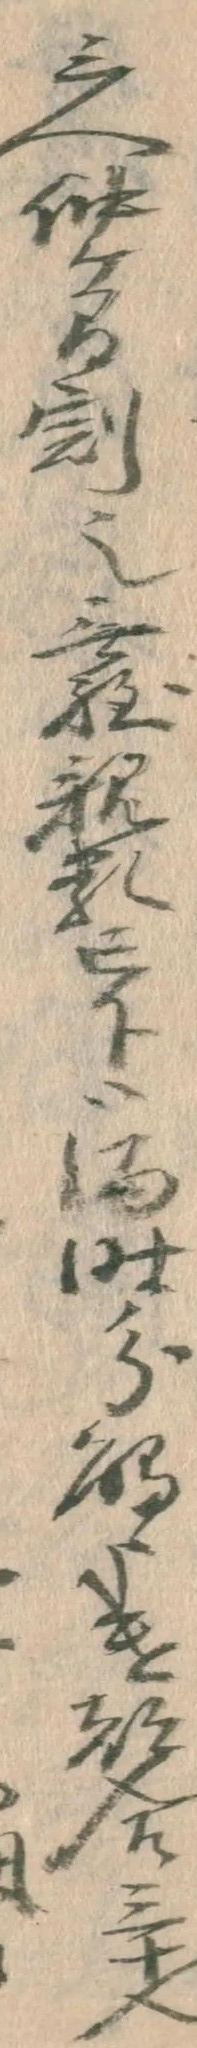三人仲ケ間割也無程親類已下御酒時分觸申遣都合三十人
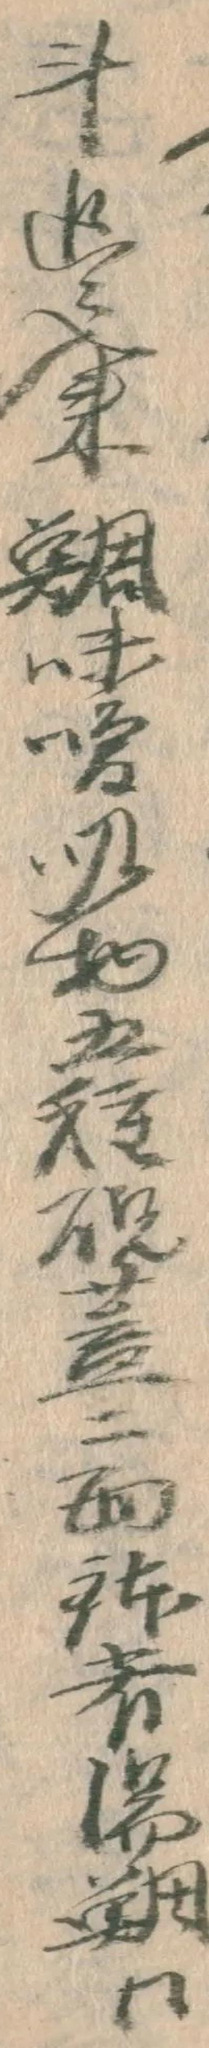斗追々入来鯛味噌吸物五種硯蓋二面鉢肴湯鯛同
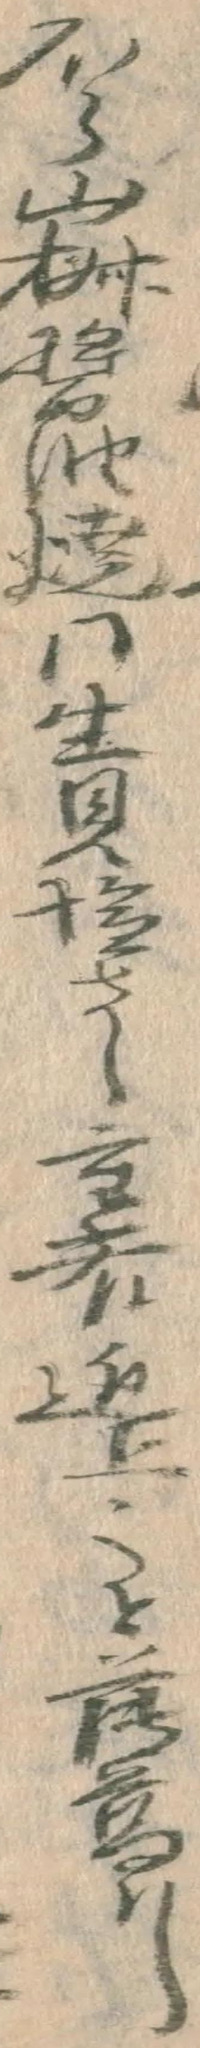ほら山椒醤油焼同生貝塩さし重肴近上うを薄葛引
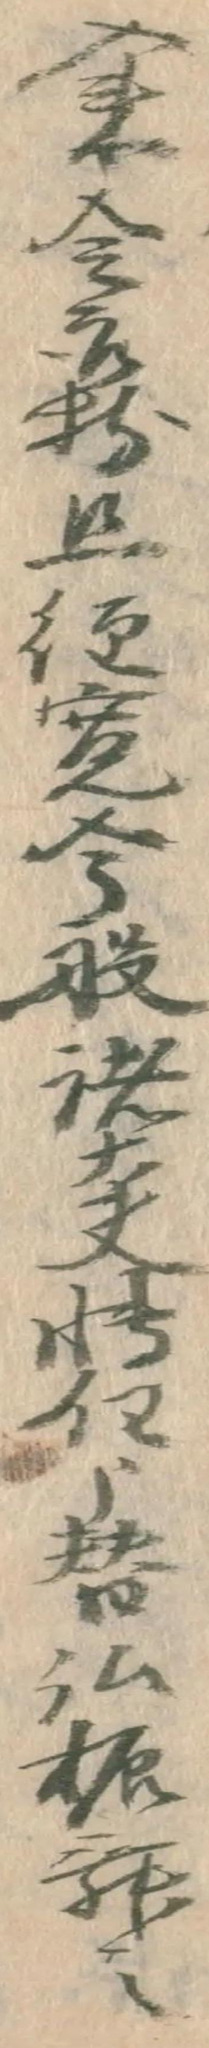入来令取揃且経寛今般諸大夫轉任申替弘振舞之
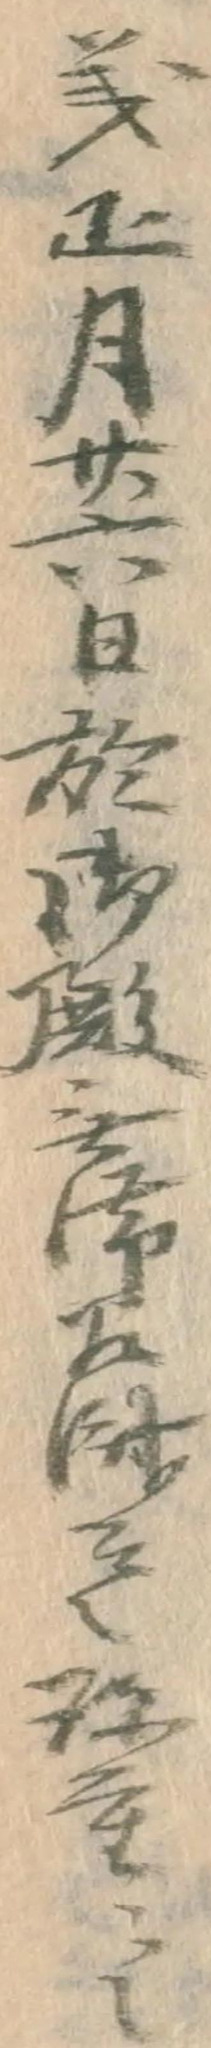義正月廿六日於御殿無滞召済云々珎重々々

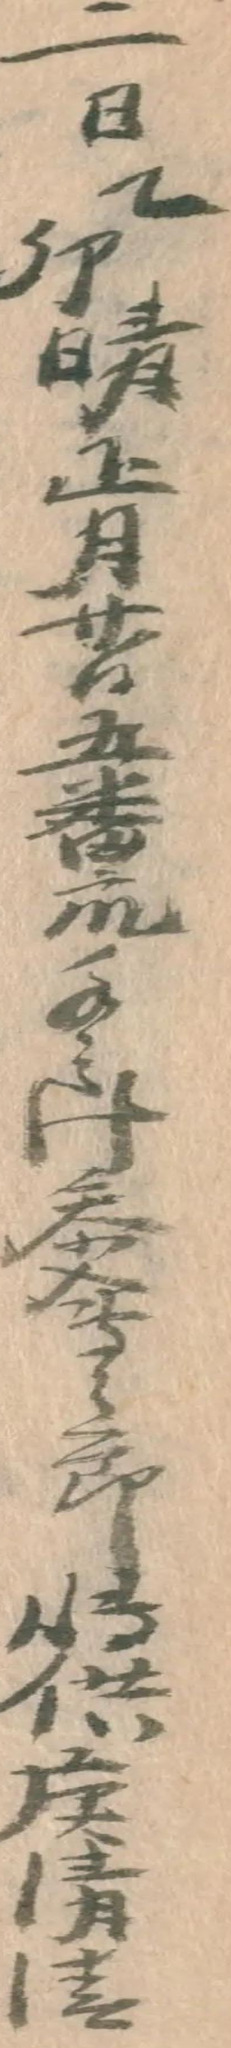二日乙卯晴正月廿日五番衆手之汁参會之節轉供庚戻清清
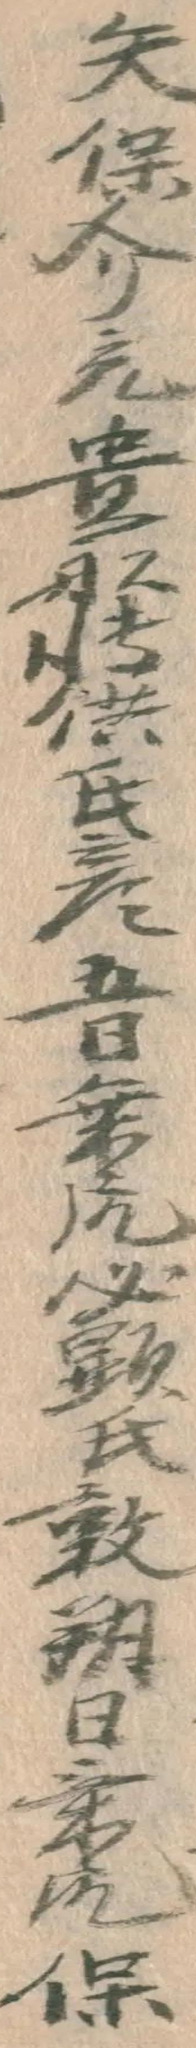矢保介充貴舩轉供氏彦五日乗尻必顕氏敦朔日乗尻保
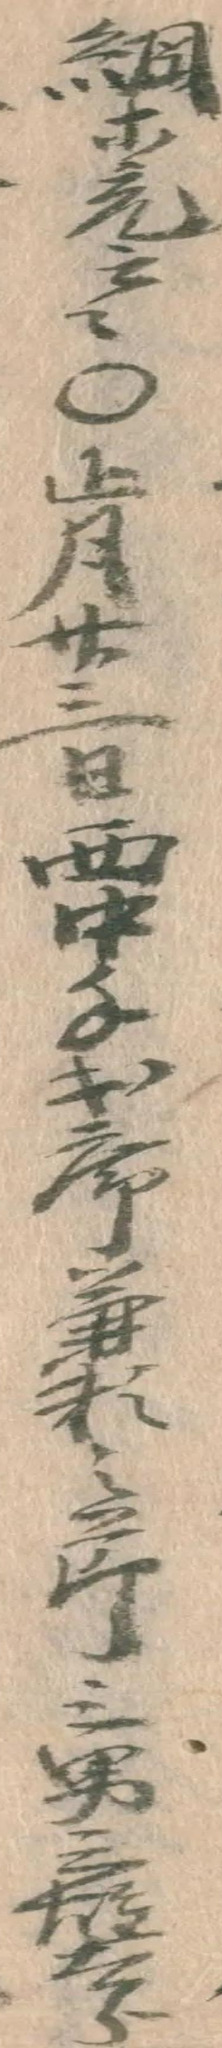綱等充云々◯正月廿三日西中手出席兼頼之節三男三雄太郎
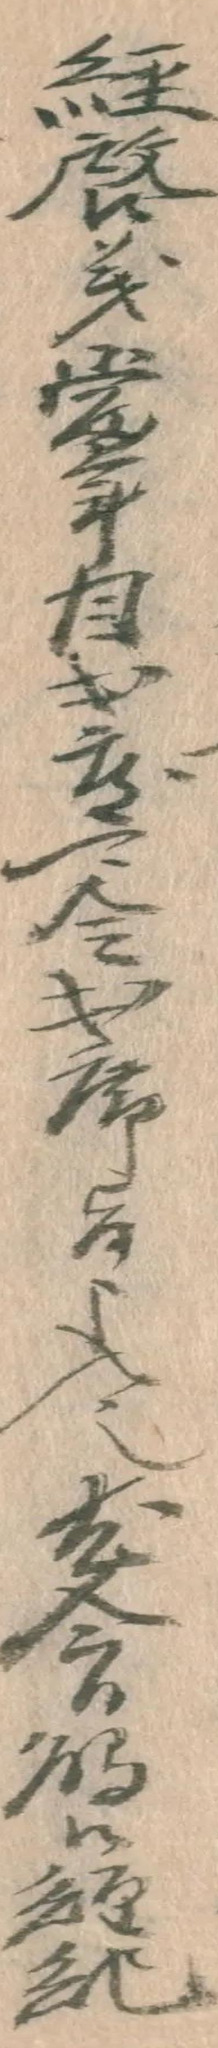経啓義當年目出度可令出席旨申入也尤今日觸え経紀
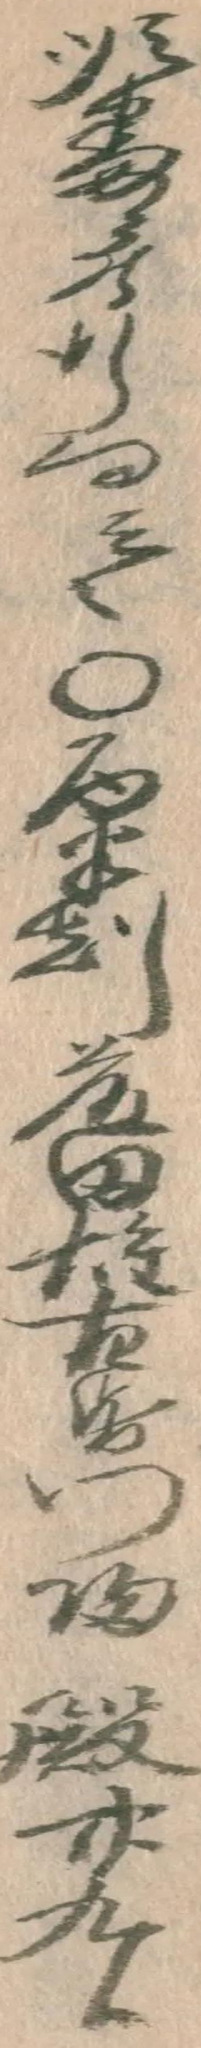順番ニ付行向云々〇酉半刻藤田権左衛門帰殿廿九日
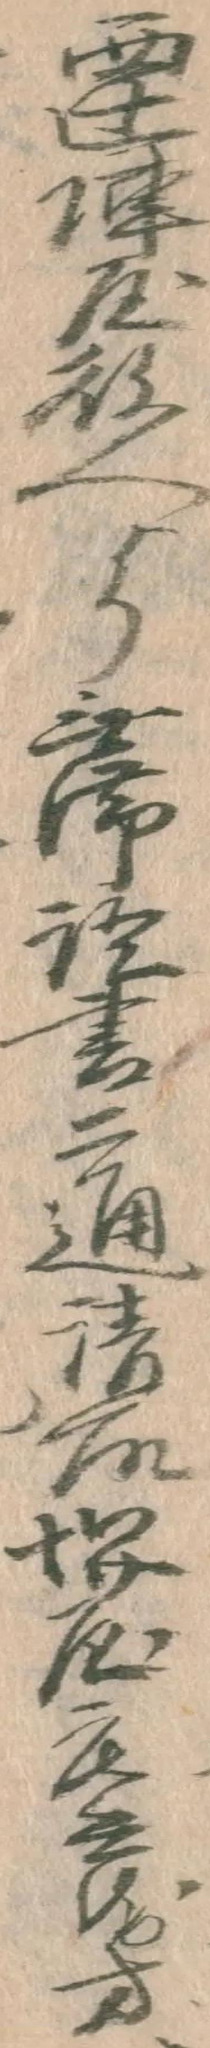西辻陣屋役人より無滞證書二通請取堺屋庄兵衛方へ
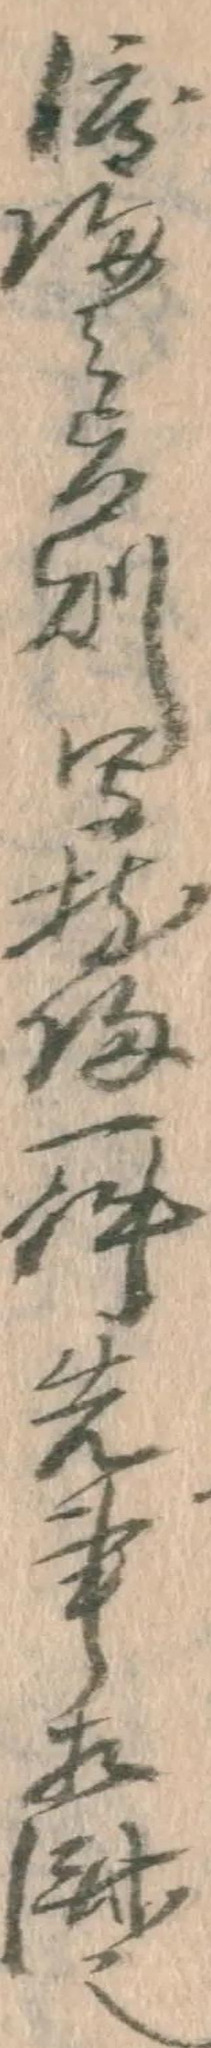渡帰之旨則写持帰一件先事相済也
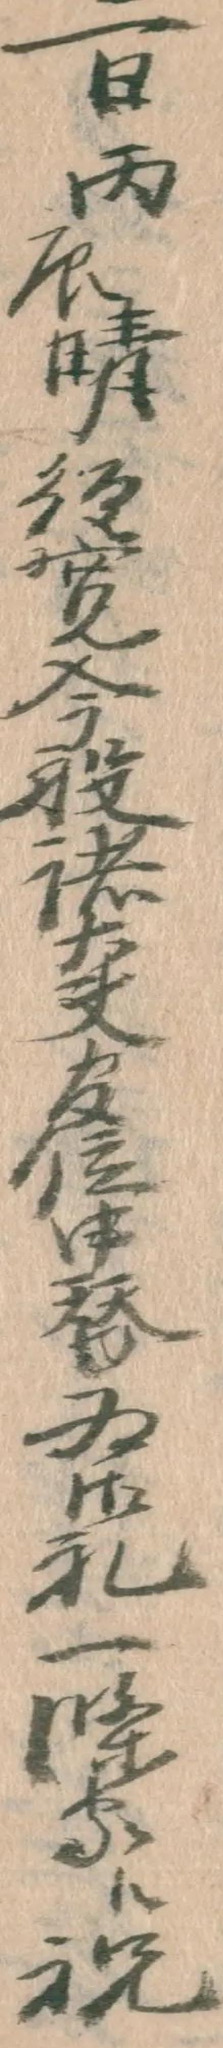三日丙辰晴経寛今般諸大夫官位申替為御礼一條家え祝
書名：賀茂社記録. 第67冊
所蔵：国立国会図書館 National Diet Library, JAPAN
